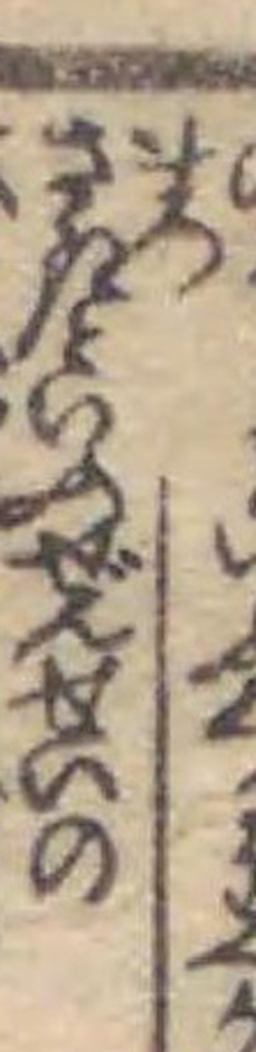さきといふぜんせいの
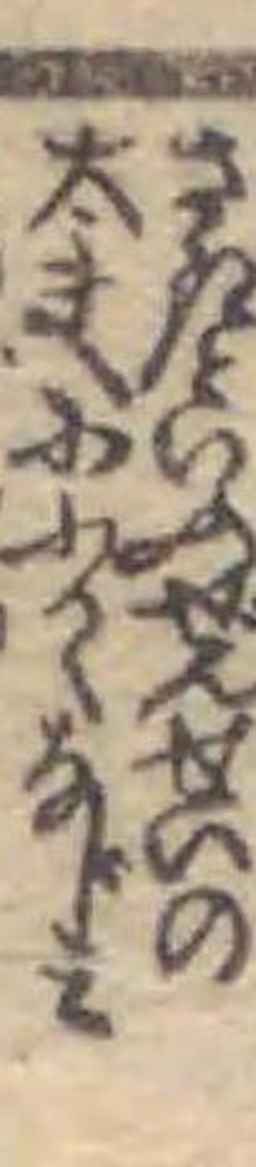太夫にふかくなじみ
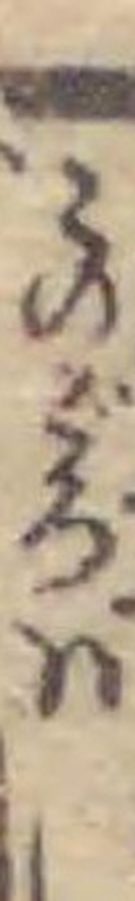このごろは
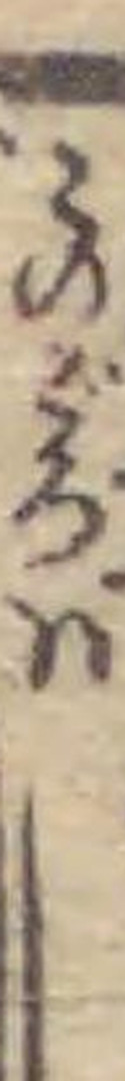このごろは
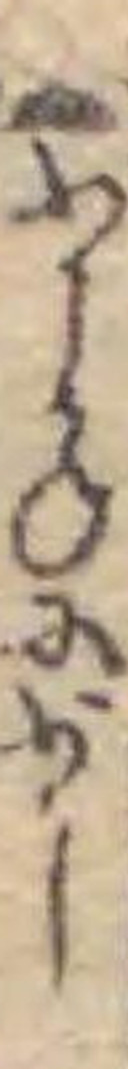少しかねに少し
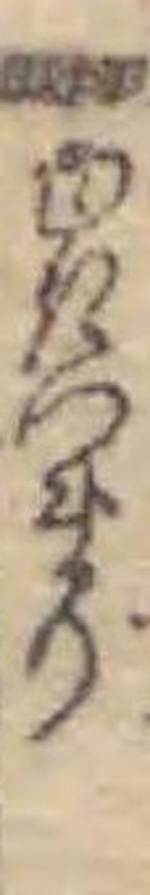ゆきつまり
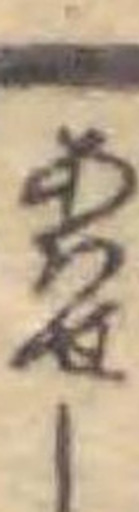あはせ
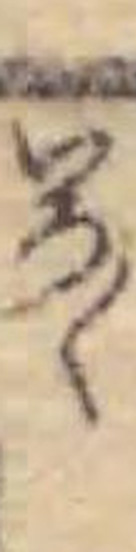いろ〳〵
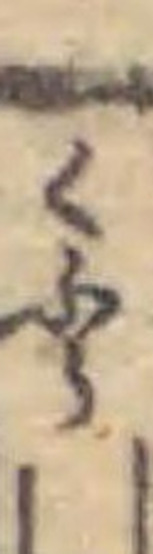くふう
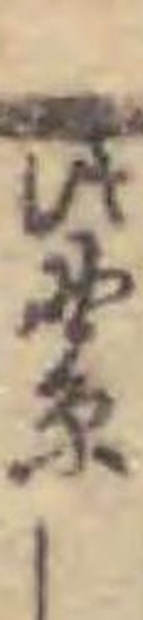此野原
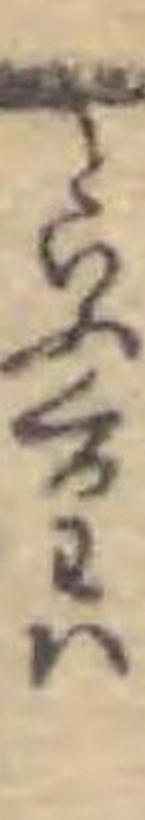といふくるわは
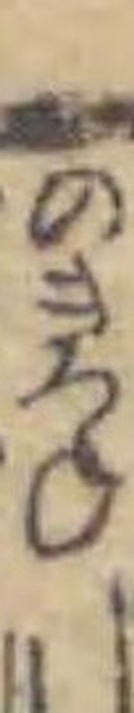のきつね
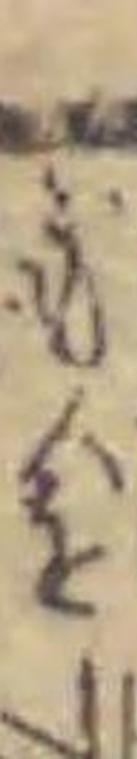ども人を
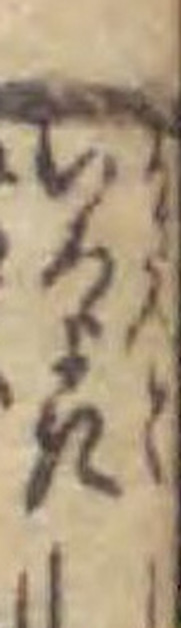いろよき
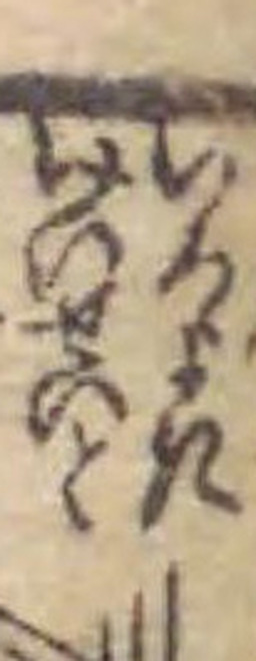けいせいと
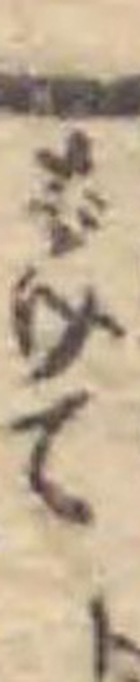ばけて
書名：扨化狐通人 : 2巻
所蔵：国立国会図書館 National Diet Library, JAPAN
